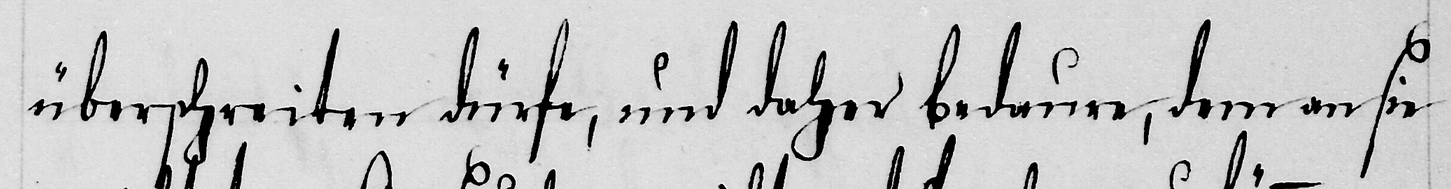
überschreiben dürfe, und daher bedaure, dem an sie
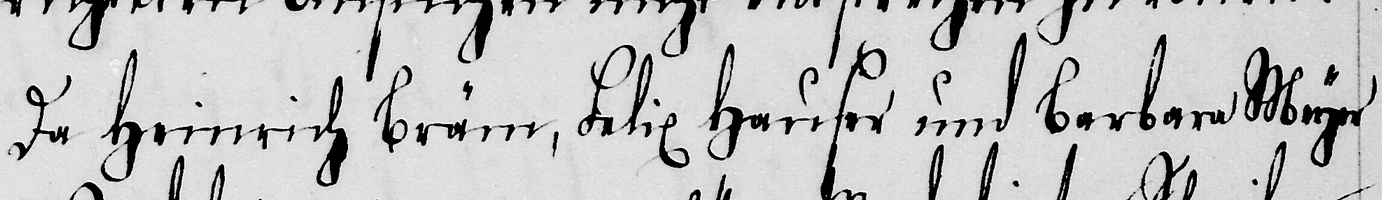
Da Heinrich Bräm, Felix Hauser und Barbara Meyer
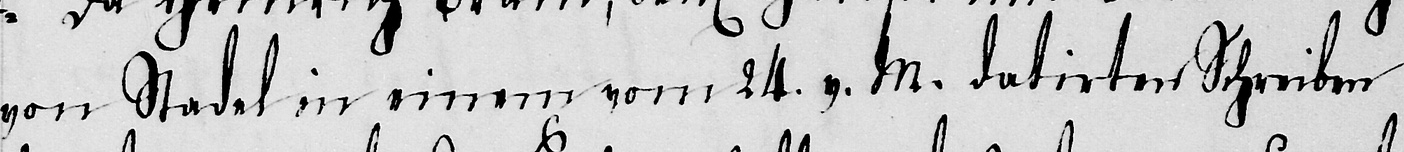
von Stadel in einem vom 24. v. M. datirten Schreiben
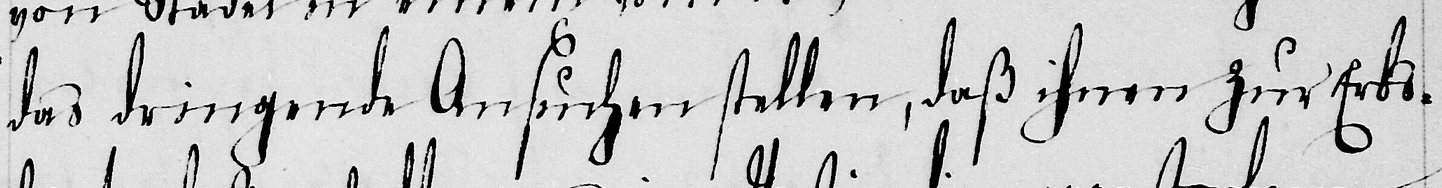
das dringende Ansuchen stellen, daß ihnen zur Erbs¬
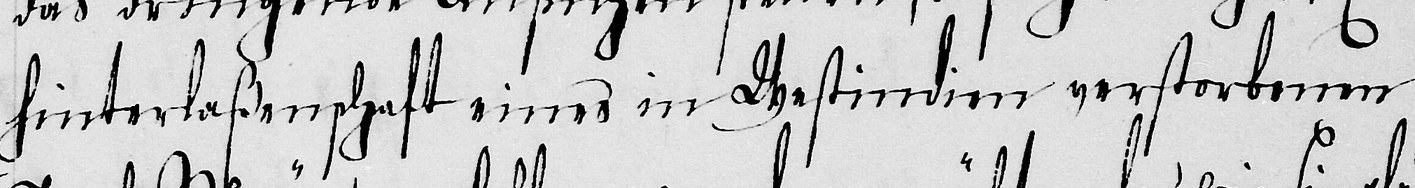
hinterlaßenschaft eines in Westindien verstorbenen
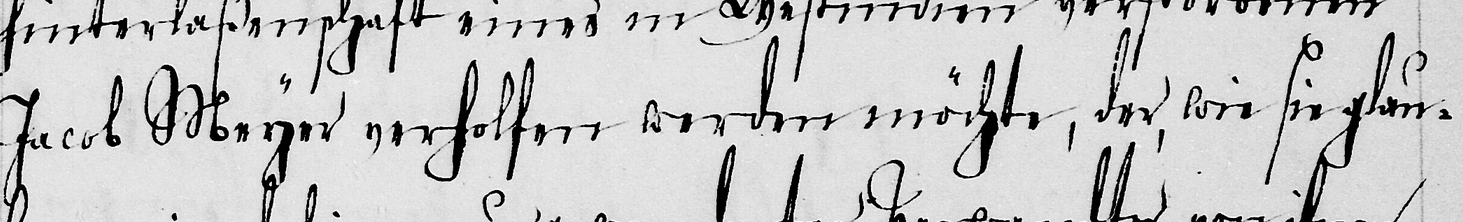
Jacob Meyer verholfen werden möchte, der, wie sie glau¬
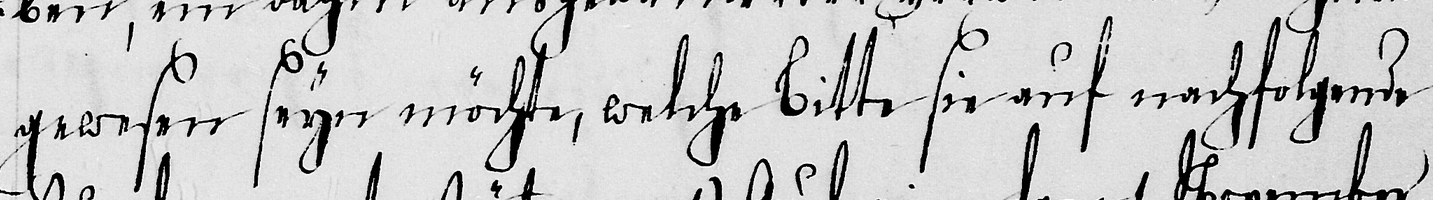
gewesen seyn möchte, welche Bitte sie auf nachfolgende
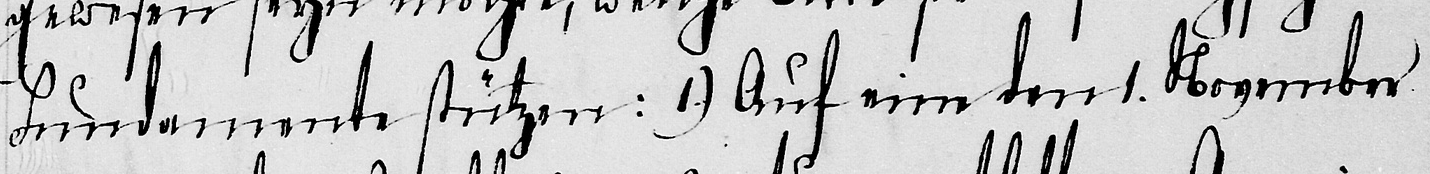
Fundamente stützen: 1.) Auf eine den 1. November
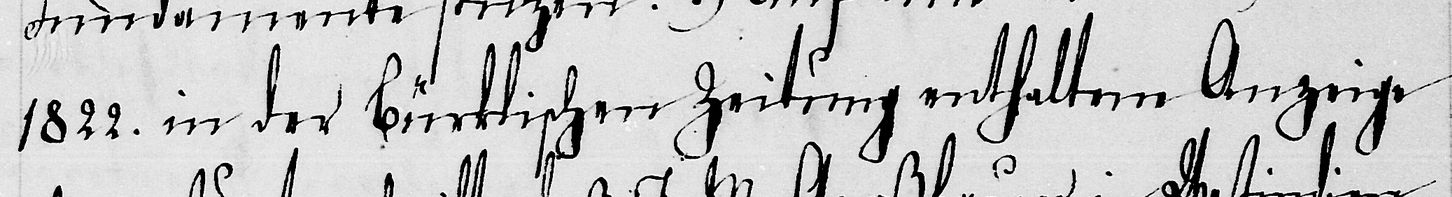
1822. in der bürklischen Zeitung enthaltene Anzeige
